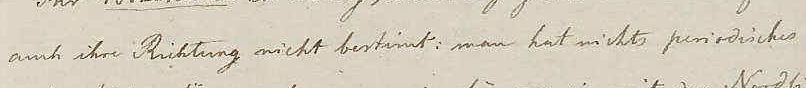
auch ihre Richtung nicht bestimt: man hat nichts periodisches
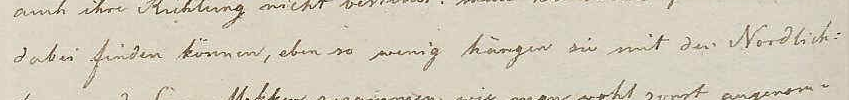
dabei finden können, eben so wenig hängen sie mit den Nordlich-
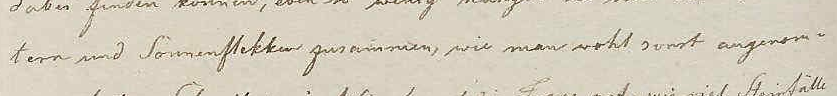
tern und Sonnenflekken zusammen, wie man wohl sonst angenom-
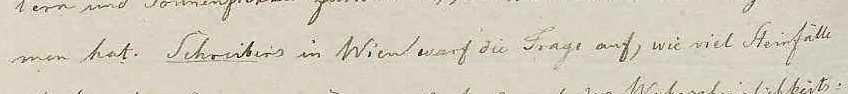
men hat. Schreibers in Wien warf die Frage auf, wie viel Steinfälle
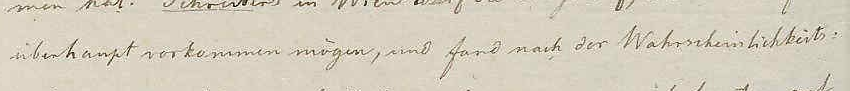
überhaupt vorkommen mögen, und fand nach der Wahrscheinlichkeits-
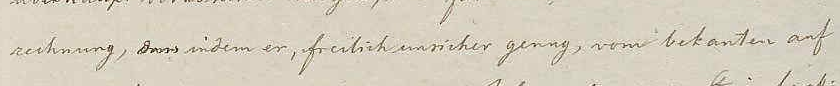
rechnung, dass indem er, freilich unsicher genug, vom bekanten auf
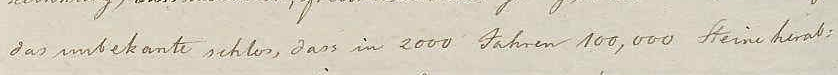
das unbekante schlos, dass in 2000 Jahren 100,000 Steine herab-
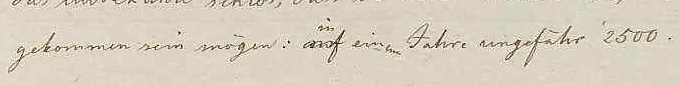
gekommen sein mögen: aufin einem Jahre ungefähr 2500.
